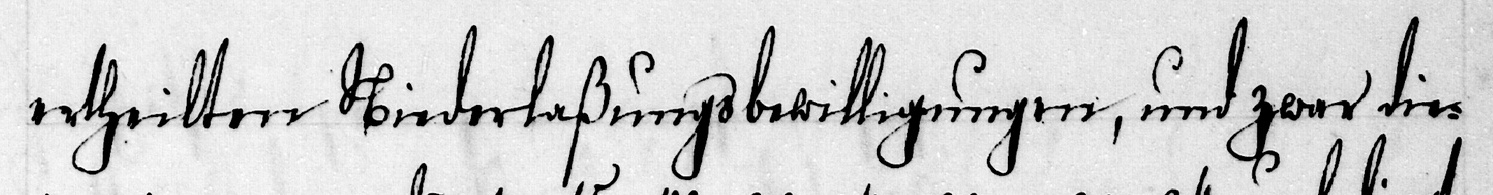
ertheilten Niederlaßungsbewilligungen, und zwar die¬
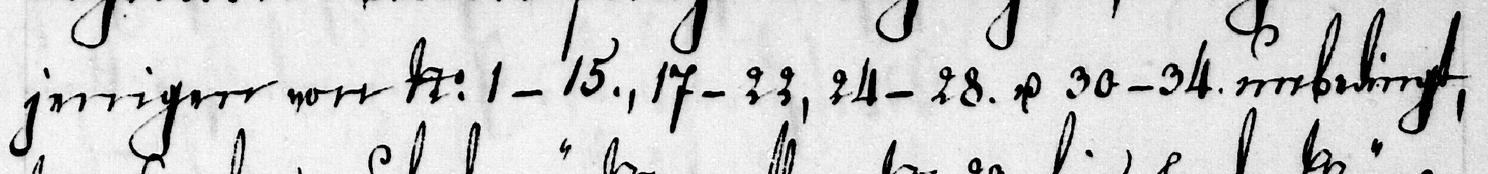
jenigen von No. 1–15., 17–22, 24–28. u. 30–34. unbedingt,
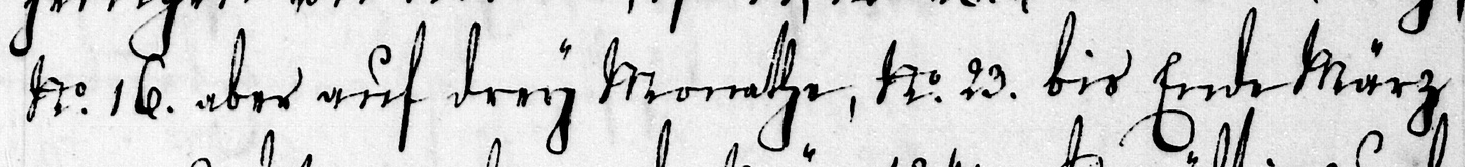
No. 16. aber auf drey Monathe, No. 23. bis Ende März
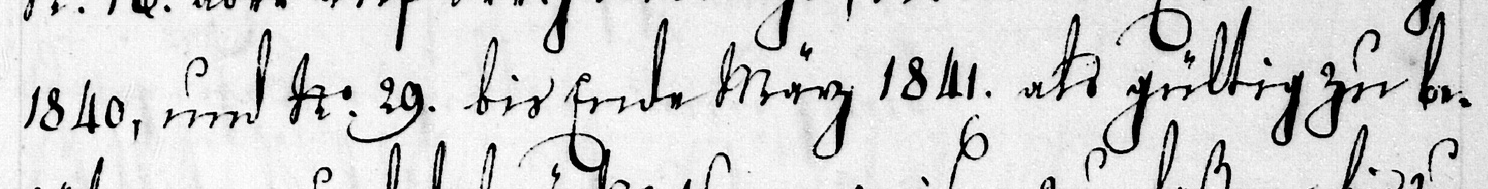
1840, und No. 29. bis Ende März 1841. als gültig zu be¬
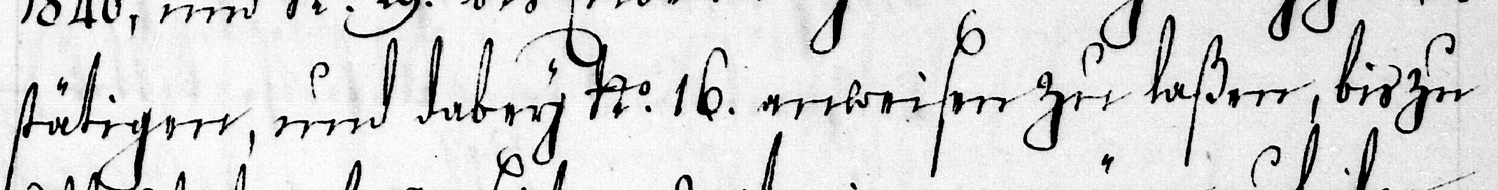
stätigen, und dabey No. 16 anweisen zu laßen, bis zu
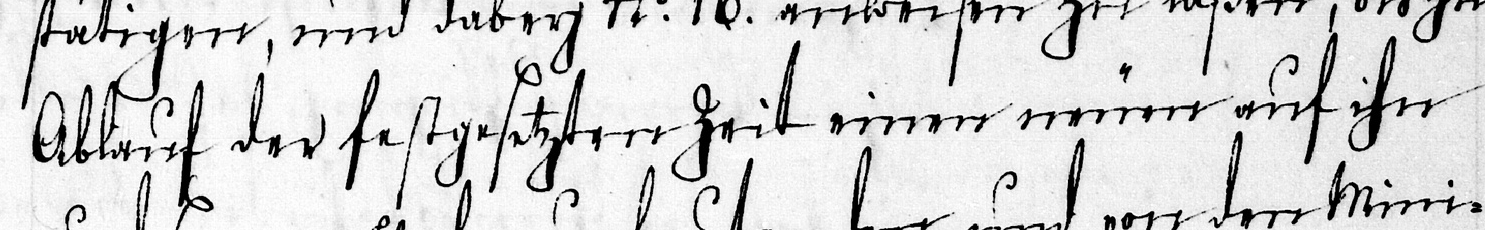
Ablauf der festgesetzten Zeit einen neuen auf ihn
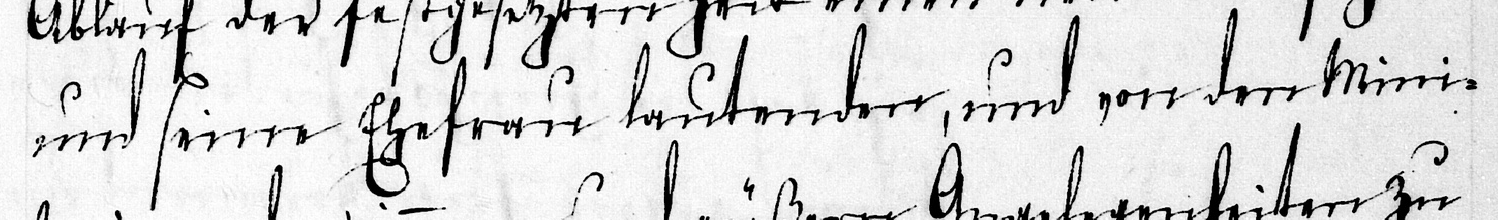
und seine Ehefrau lautenden, und von den Mini¬
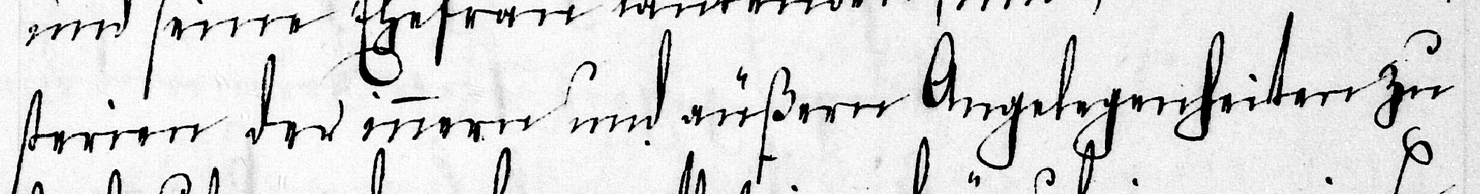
sterien der innern und äußern Angelegenheiten zu
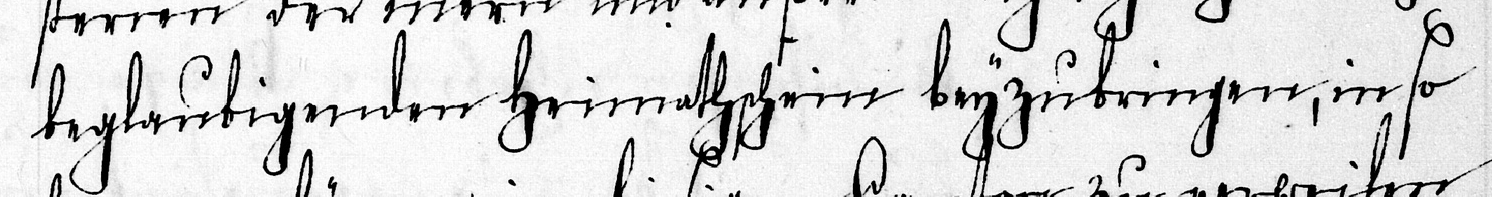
beglaubigenden Heimathschein beyzubringen, in so
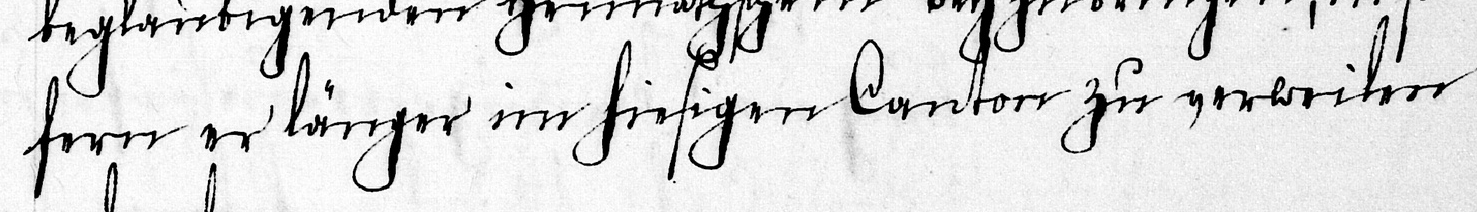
fern er länger im hiesigen Canton zu verweilen
